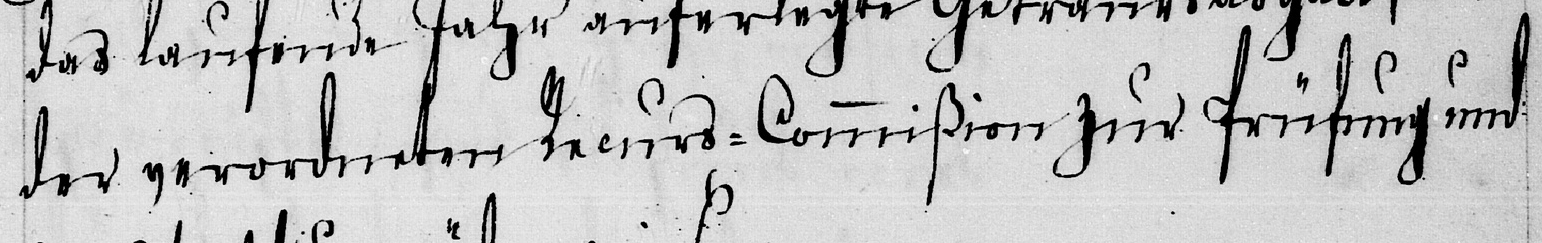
der verordneten Recurs-Commmißion zur Prüfung und
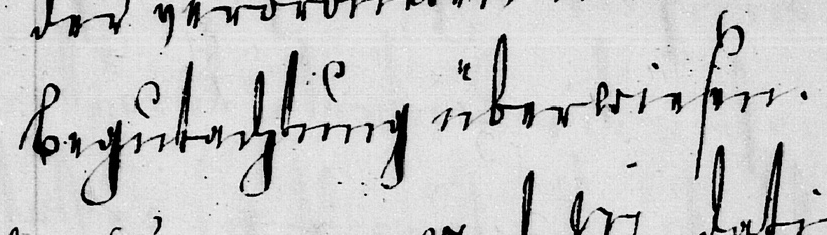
Begutachtung überwiesen.
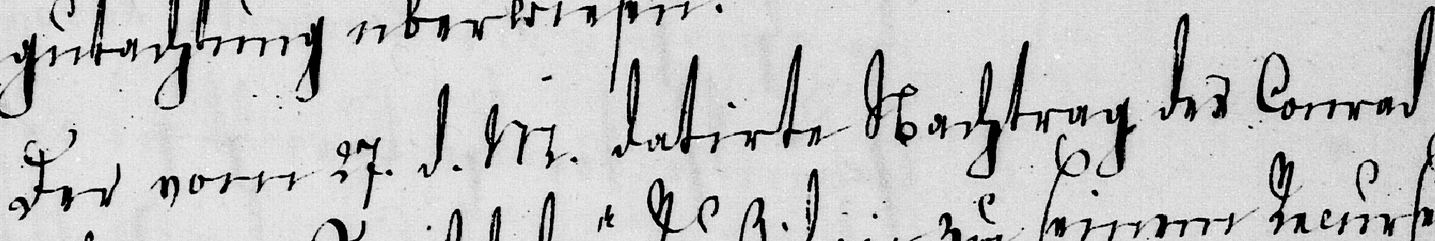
Der vom 27. d. M. datirte Nachtrag des Conrad
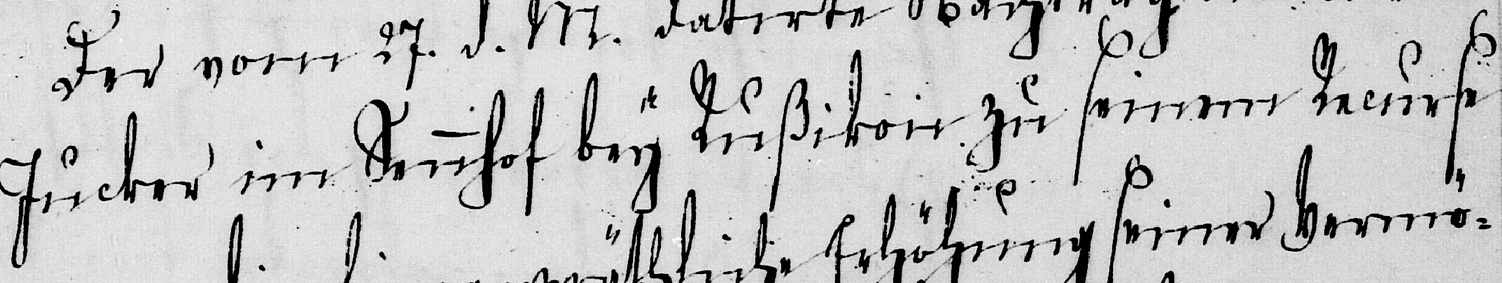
Jucker im Sennhof bey Rußikon zu seinem Recurse
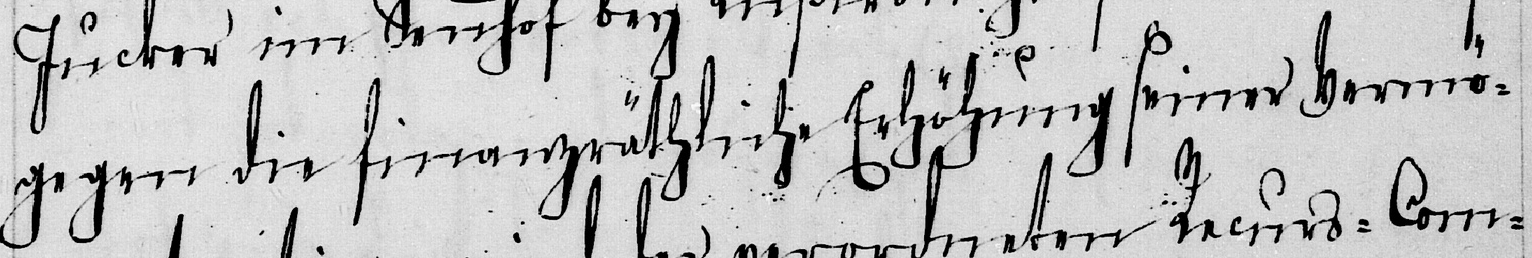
gegen die finanzräthliche Erhöhung seiner Vermö¬
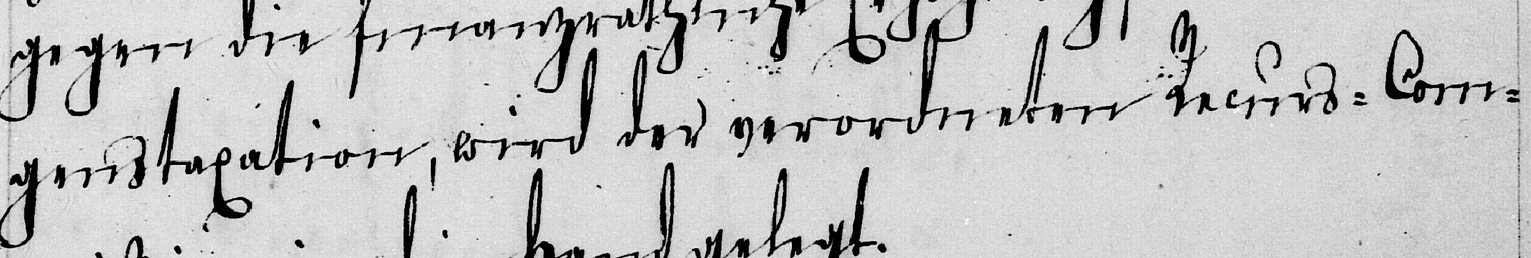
genstaxation, wird der verordneten Recurs-Com¬
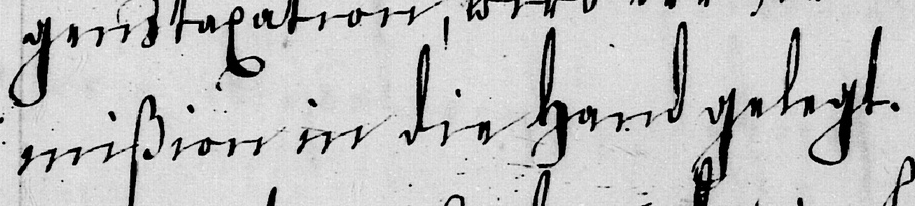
mißion in die Hand gelegt.
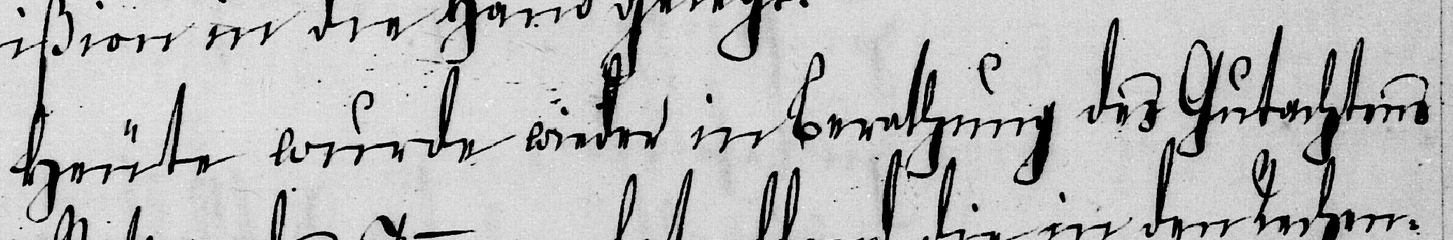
Heute wurde wieder in Berathung des Gutachtens
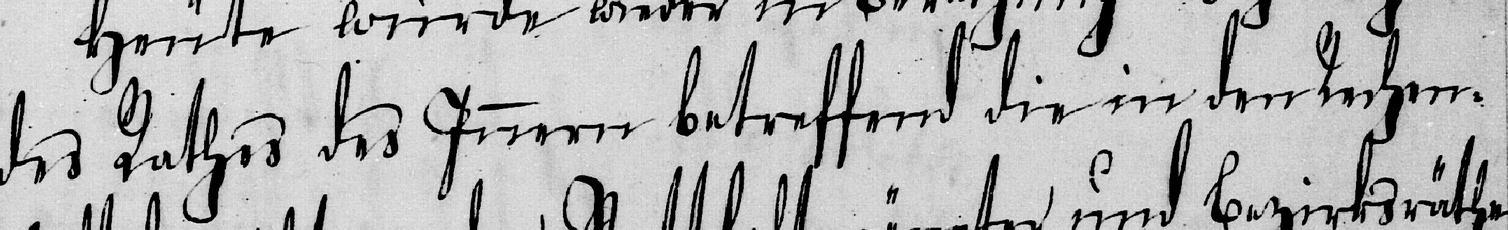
des Rathes des Innern betreffend die in den Rechen¬
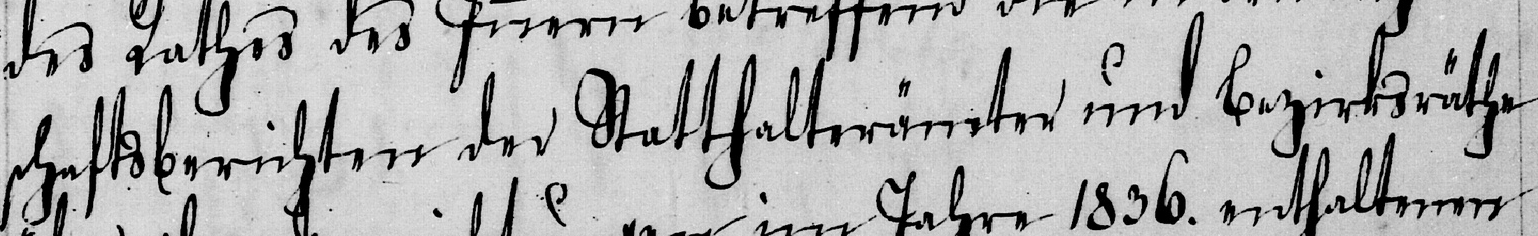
schaftsberichten der Statthalterämter und Bezirksräthe
